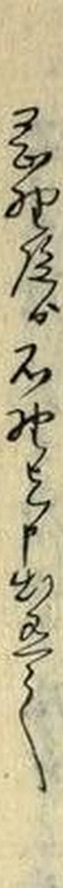岡野殿ゟ石野迄申出有之
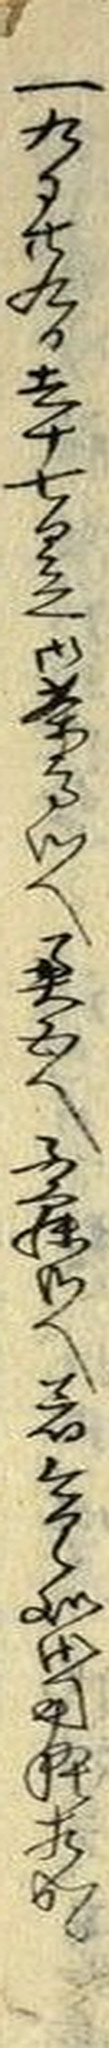一九月廿九日去十七日立御茶方弐人奥五人不寝弐人着今日之処御用捨相成候
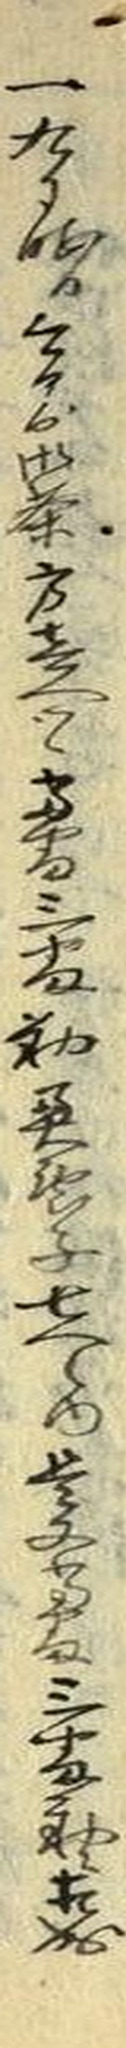一九月晦日今日ゟ御茶方壱人ツヽ当番三番勤奥台子七人之内是又当番三番勤ニ相成
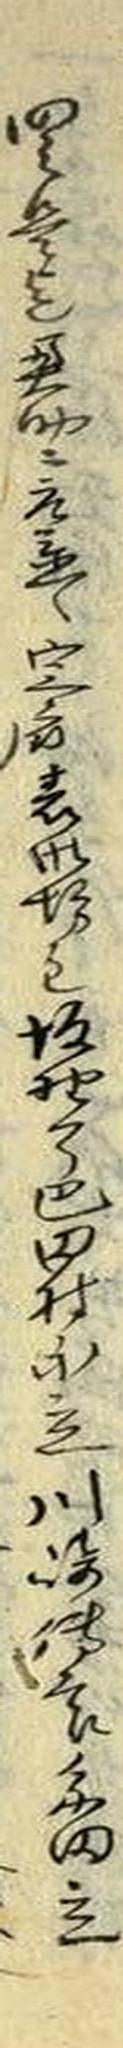仍之是迄奥助ニ取置候定府表御坊主坂野了巴田村永立川崎伝節多田立
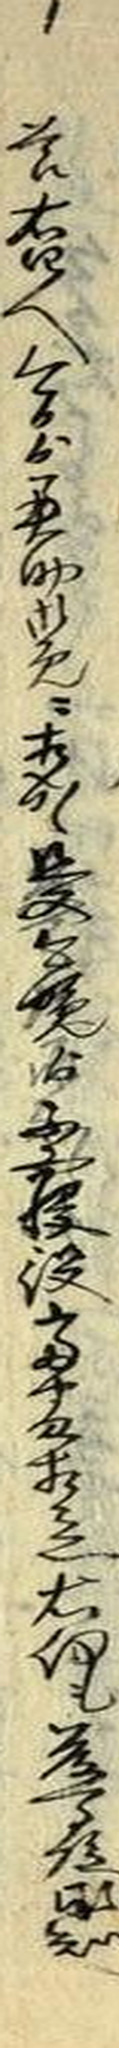節右四人今日ゟ奥助御免ニ相成候且又今晩ゟ不寝役当番相立右何も藤馬殿へ承知
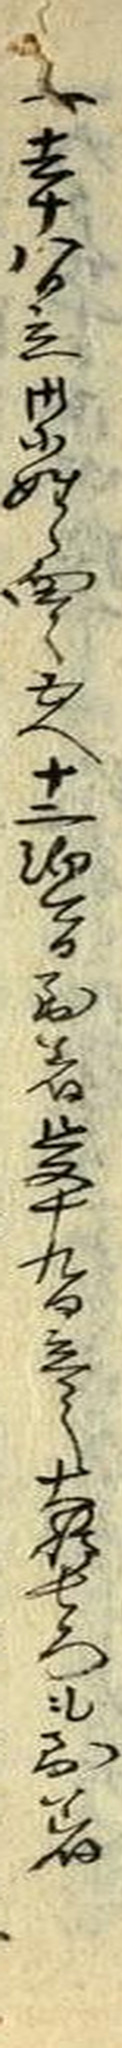一去十八日立御小姓之面々五人十二泊今日到着且又十九日立之大島七右衛門も到着
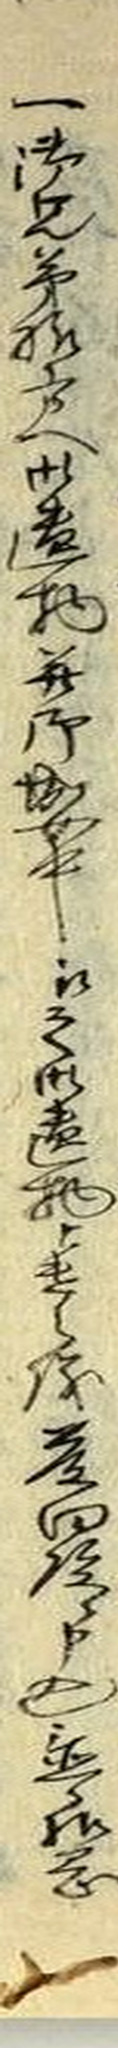一御兄弟様方へ御遺物并御城女中江之御遺物被遣候儀藤田殿ニ申込置候様岡
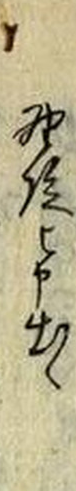野殿被申出候
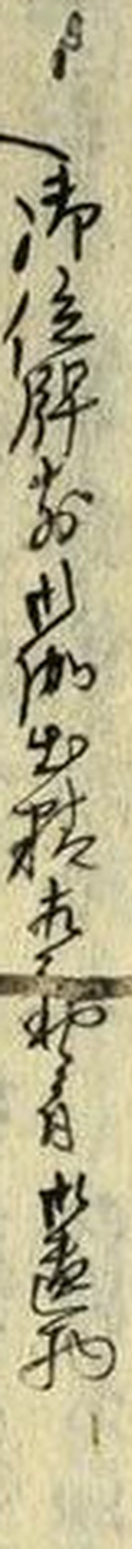御位牌前御伽出精相勤候ニ付御遺物
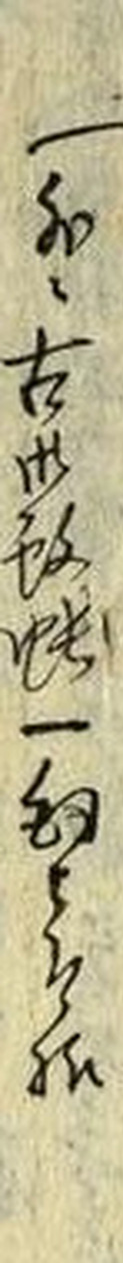外ニ古御蚊帳一釣被下候様
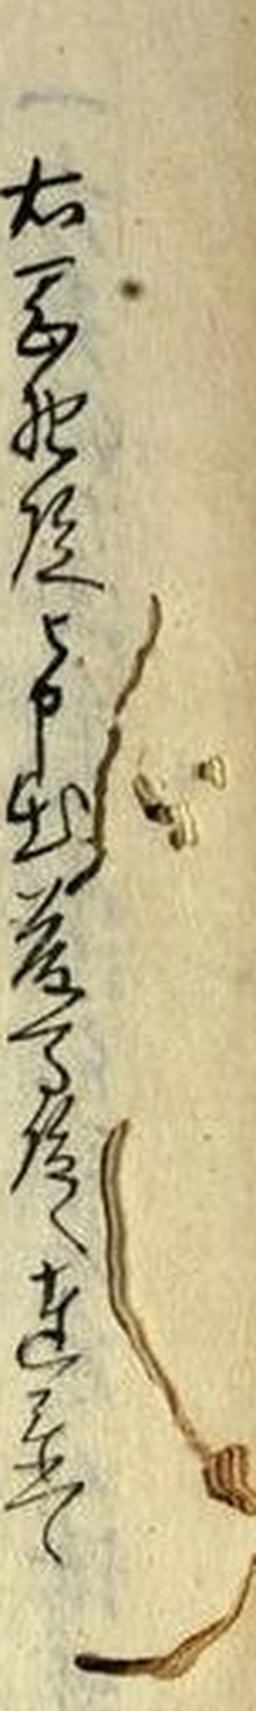右岡野殿被申出藤馬殿へ達置候
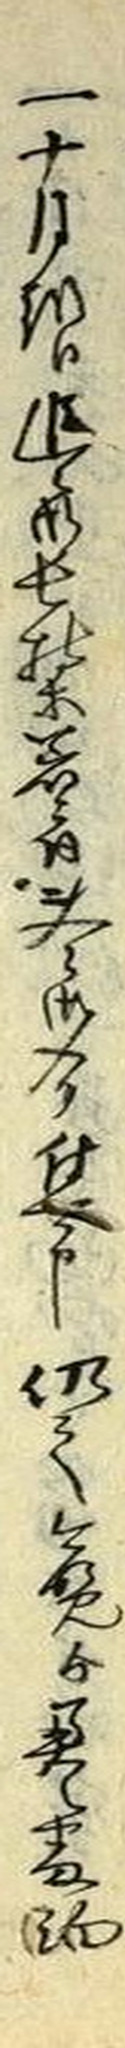一十月朔日追々御長持等着ニ付夫々御入り付可申仍之今晩ゟ奥之番泊
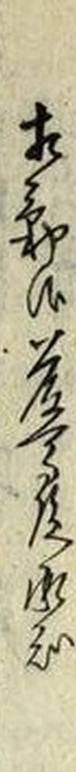相勤候藤馬殿承知
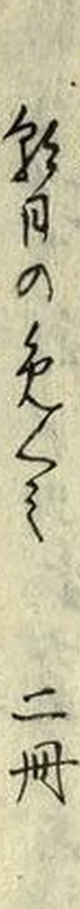朝日のめくミ二冊
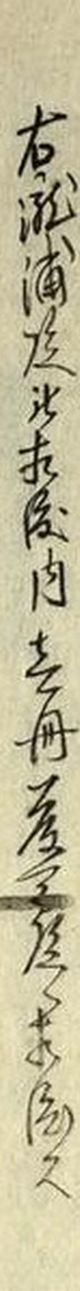右滝浦殿被渡内壱冊藤馬殿へ相渡ス
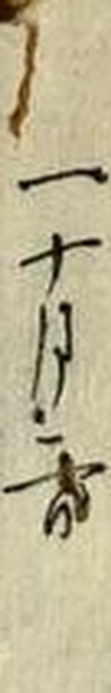一十月二日
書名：少傅日録抄（斉善付側向頭取日記、江戸并道中、初入在国、逝去後…
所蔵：福井県文書館 Fukui Prefectural Archives
